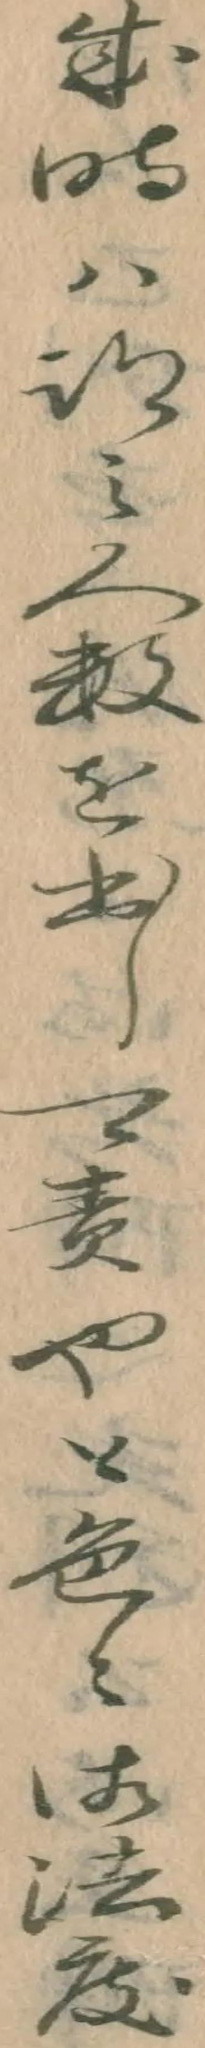成時は跡之人数を出し可責やと色々御法度
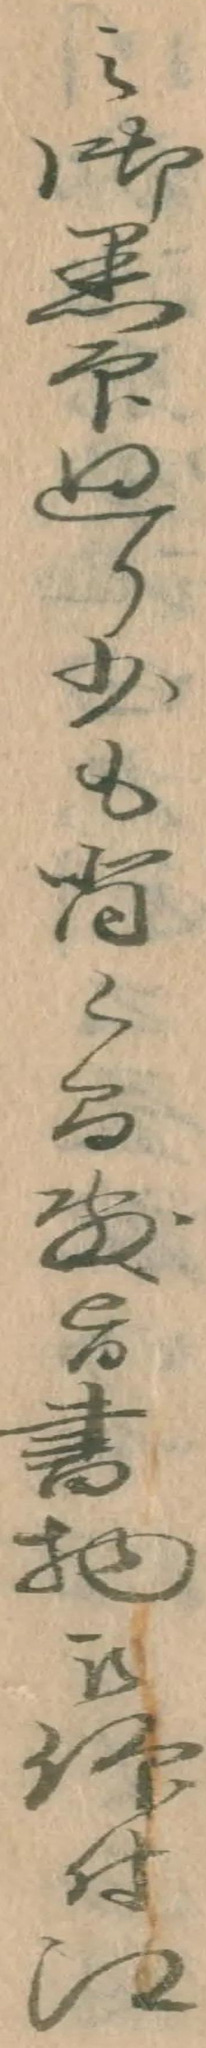之御黒印廻り少も背く間敷旨書物被仰付江
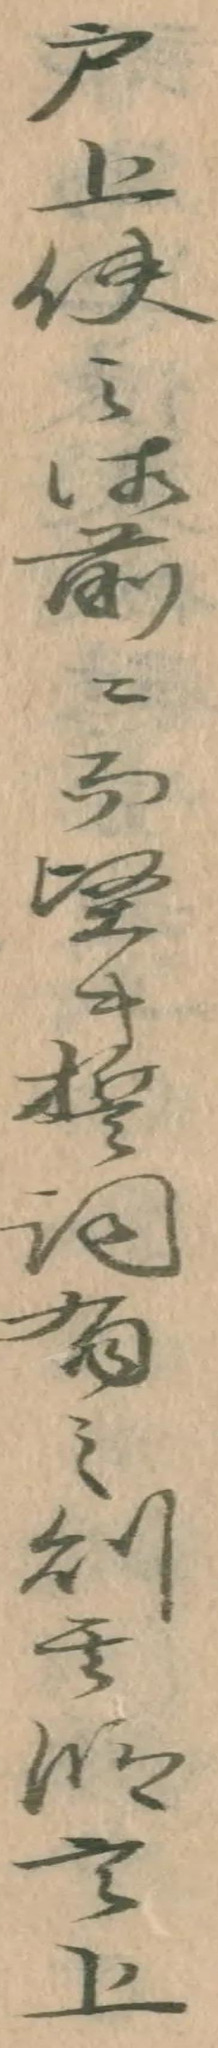戸上使之御前に而堅き誓詞有之則其段言上
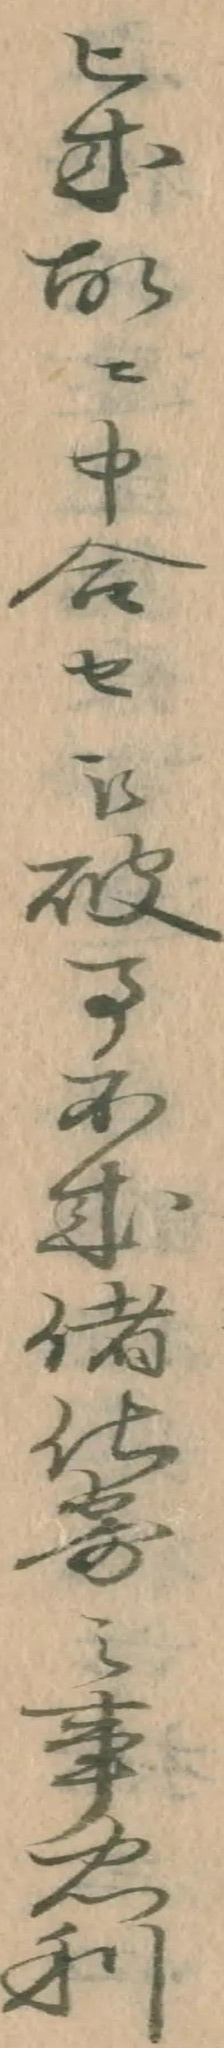被成故に申合せ被破事不成偖仕寄之事忠利
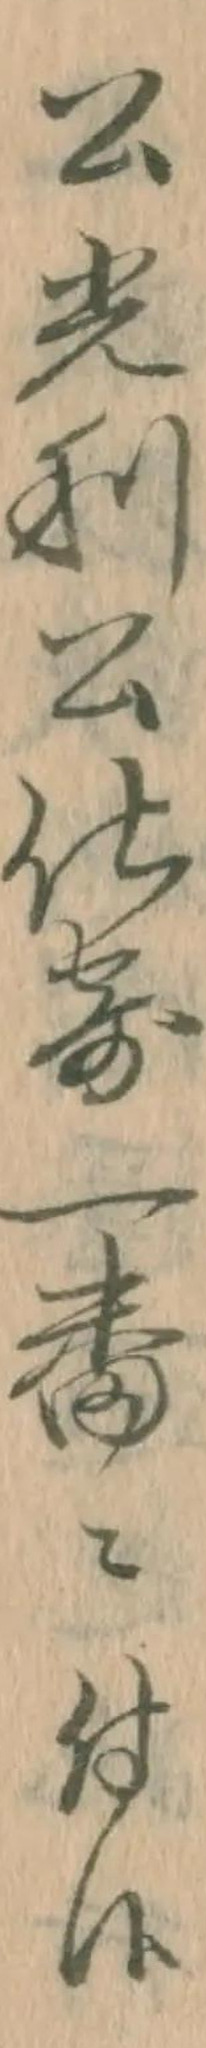公光利公仕寄一番に付候
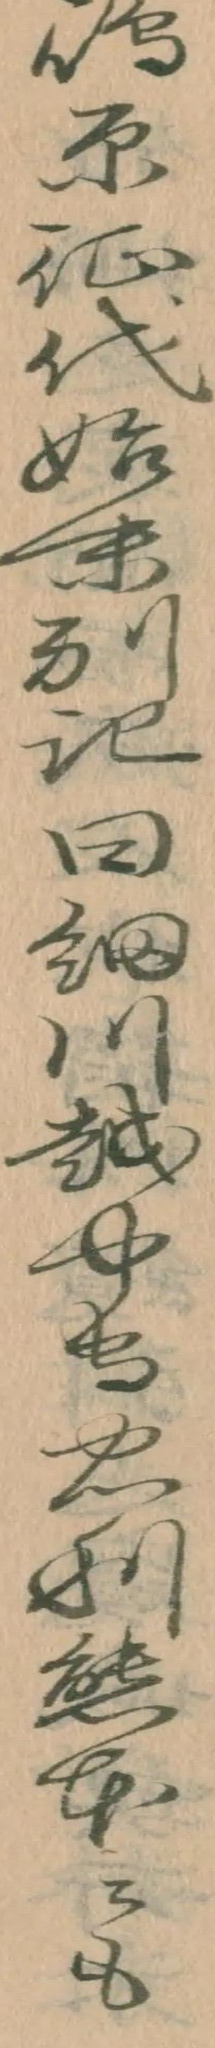島原征伐始末別記曰細川越中守忠利熊本にも
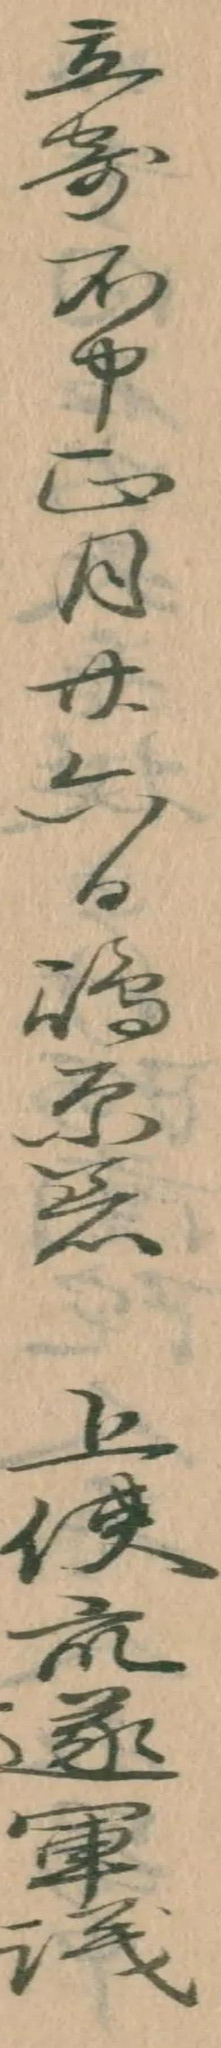立寄不申正月廿六日島原着上使衆遂軍議
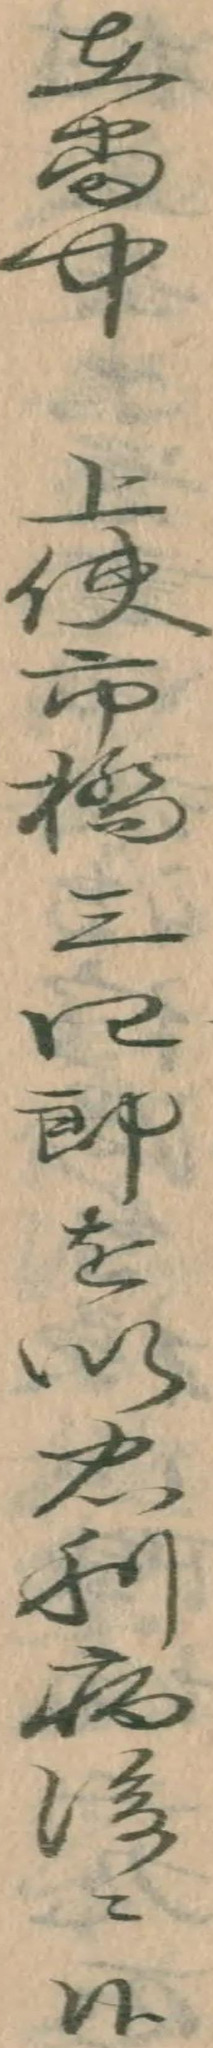在番中上使市橋三四郎を以忠利病後に候
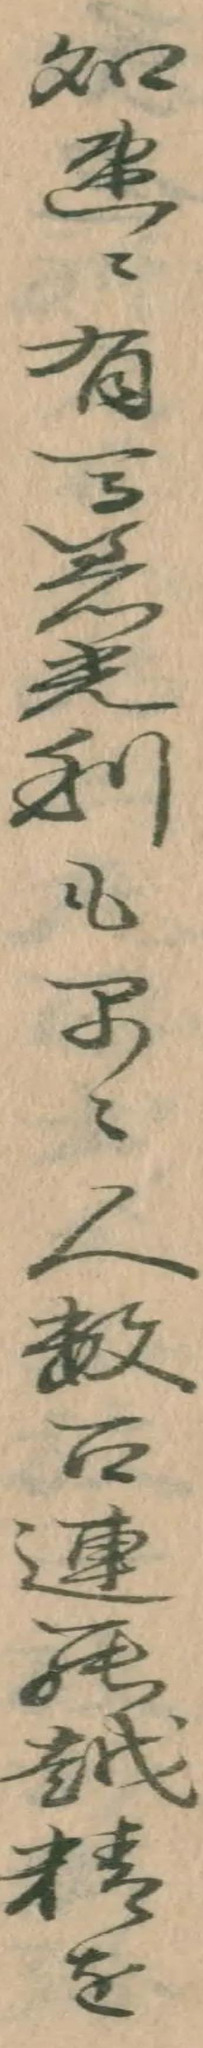処速に有馬着光利も早々人数召連罷越精を
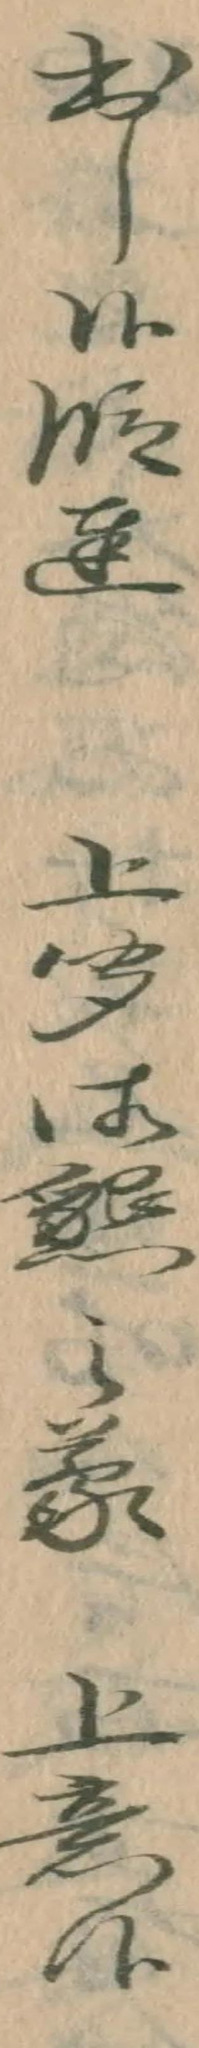出し候段達上聞御懇之承上意候
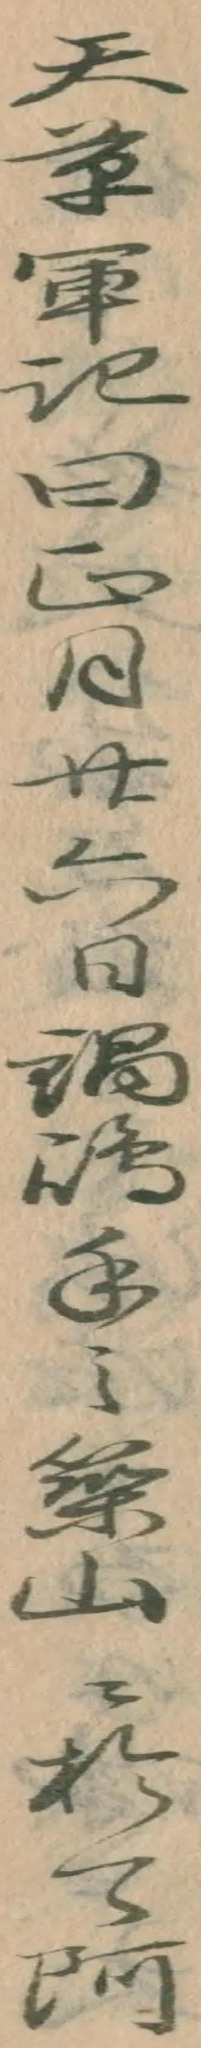天草軍記曰正月廿六日鍋島手之築山に於て阿
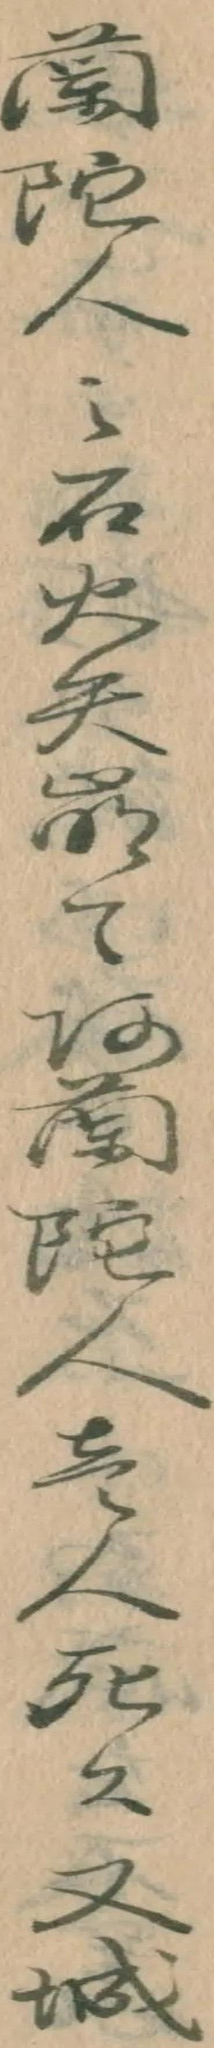蘭陀人之石火矢崩て阿蘭陀人壱人死す又城
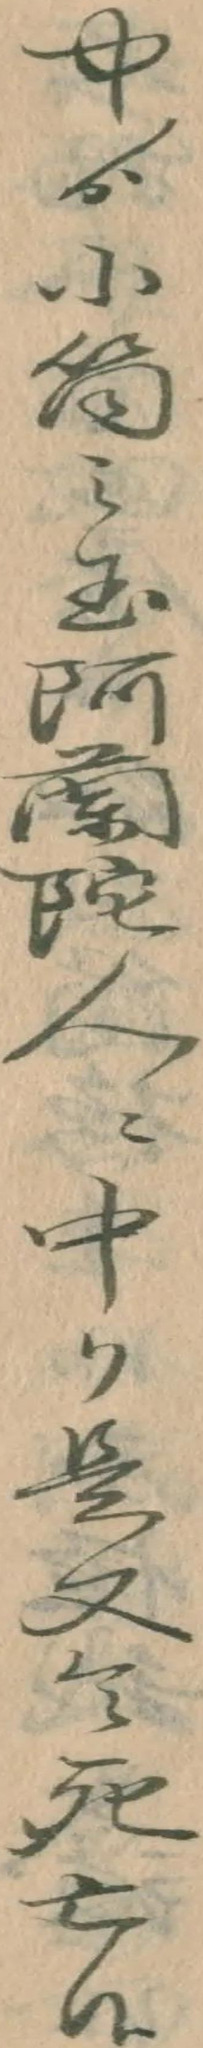中ゟ小筒之玉阿蘭陀人に中々是又令死亡候
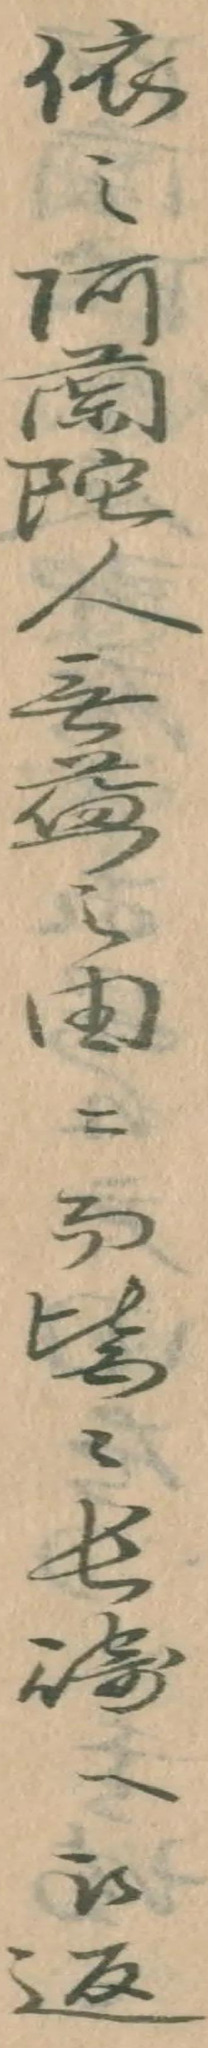依之阿蘭陀人無益之由に而皆々長崎へ被返

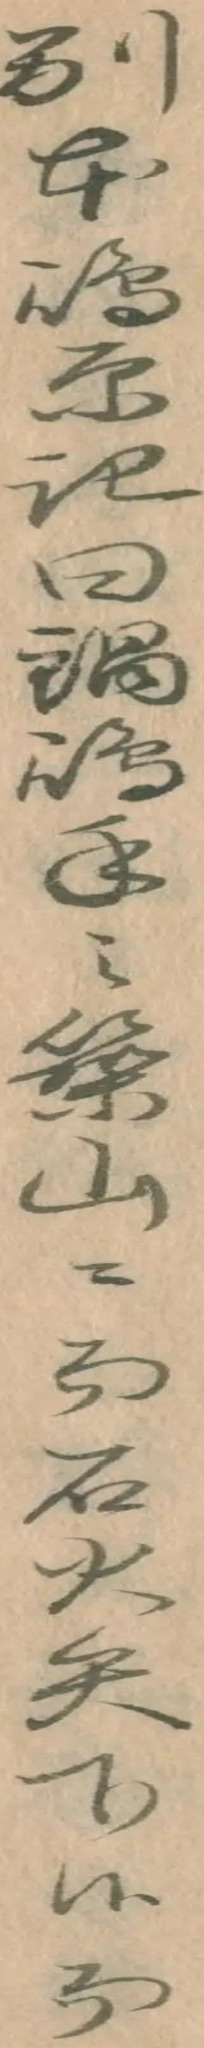別本島原記曰鍋島手之築山に而石火矢下候而
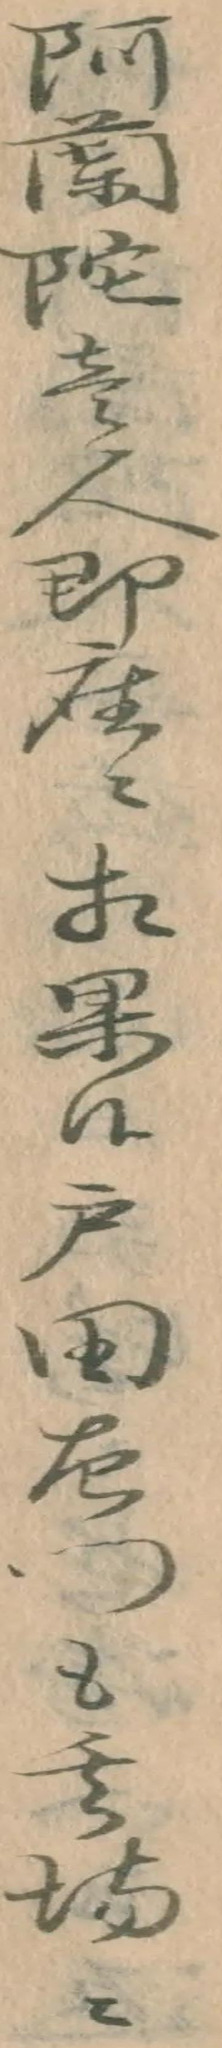阿蘭陀壱人即座に相果候戸田左門も其場に
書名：切支丹御退治記 49巻. [6]
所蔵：国立国会図書館 National Diet Library, JAPAN
